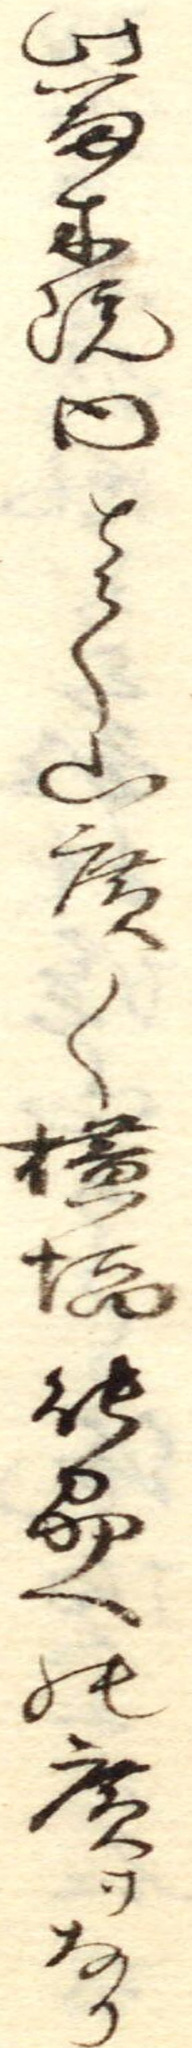此冨木院内とて山広く横幅能州への広さなり
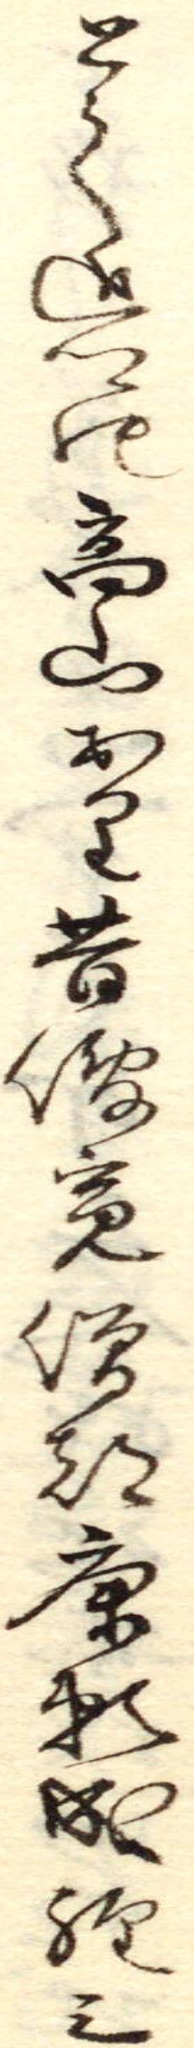とて近郷の高山あり昔俊寛僧都康頼成経三
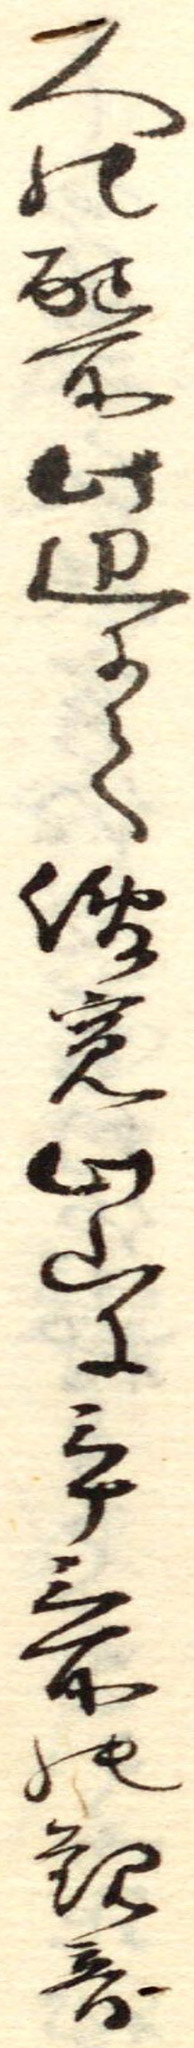人の配所此辺にて俊寛此山に三十三所の観音
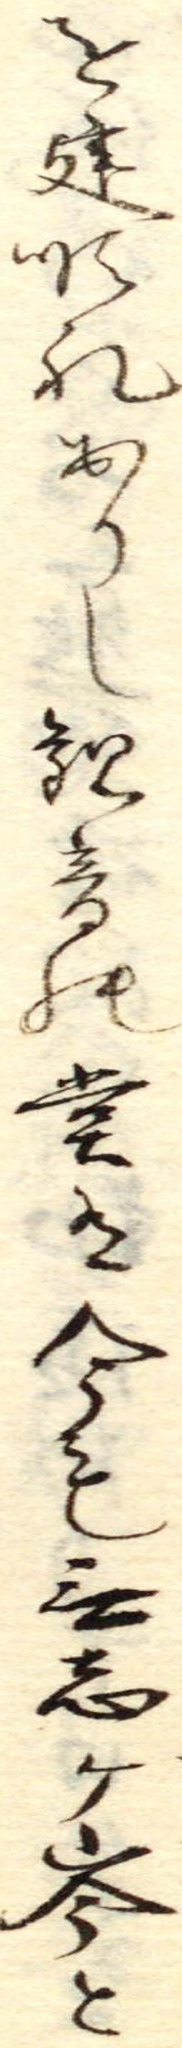を建順礼ありし観音の堂有今も無志ヶ岑と
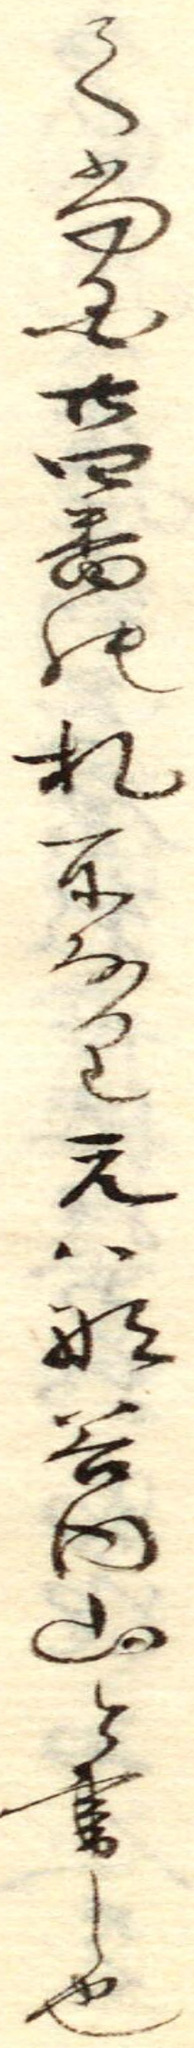て当国廿四番の札所なり元は那谷内山と書し也
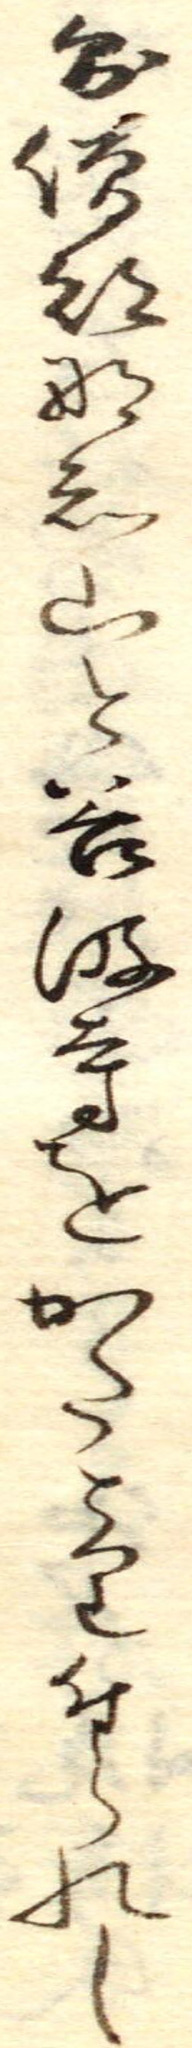則僧都那知山と谷汲寺をかたとり付られし
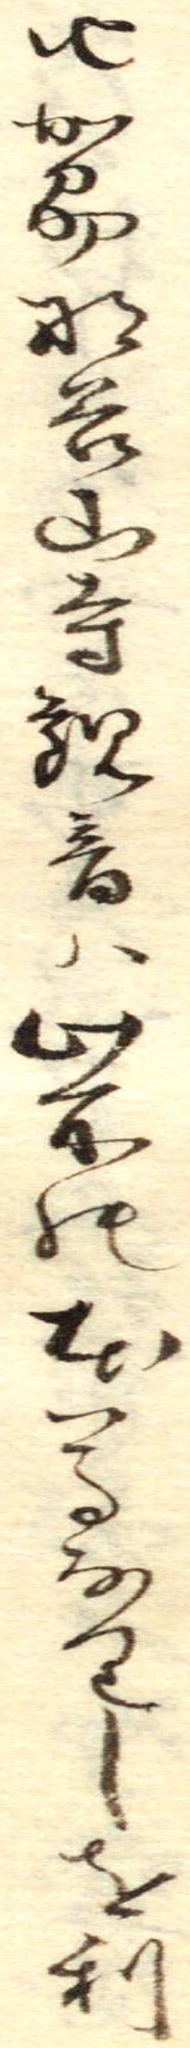由加州那谷山寺観音は此所の本尊なりしを利

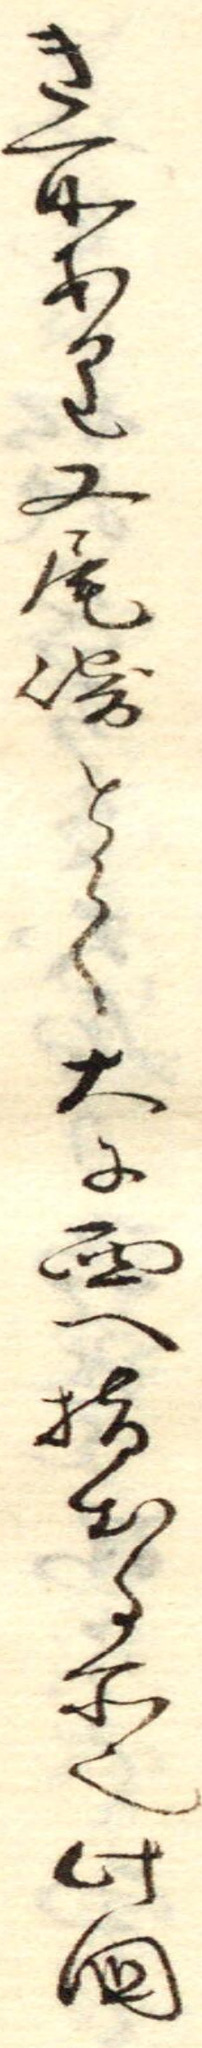き所あり又尾崎とて大に西へ指出る所也此国
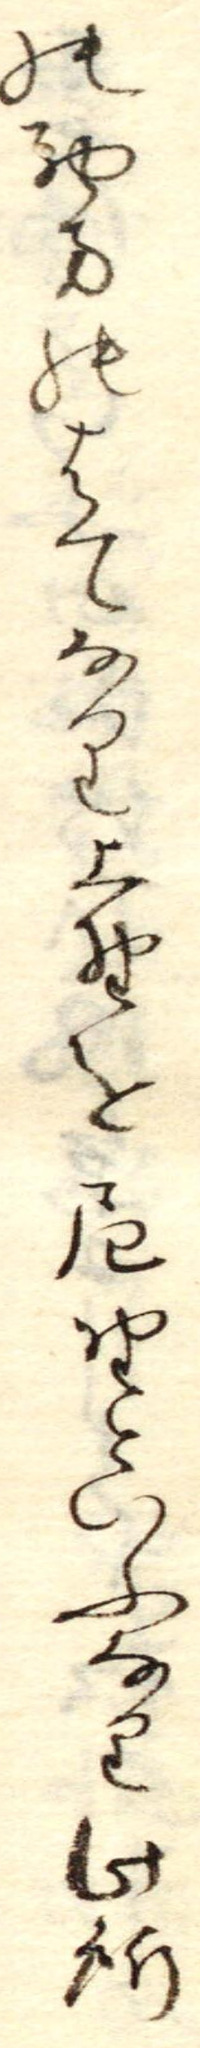の西方のはてなり上野を尼野といふなり此所
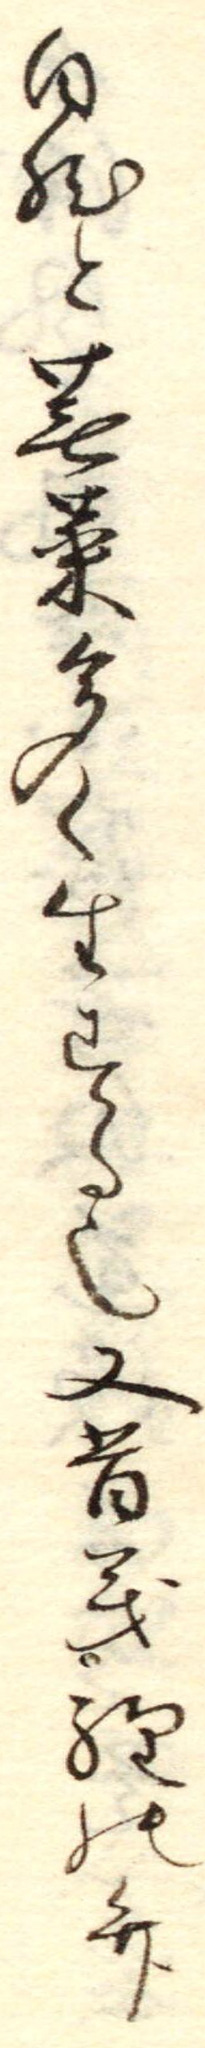自然と蕪菜多く生する也又昔義経の弁
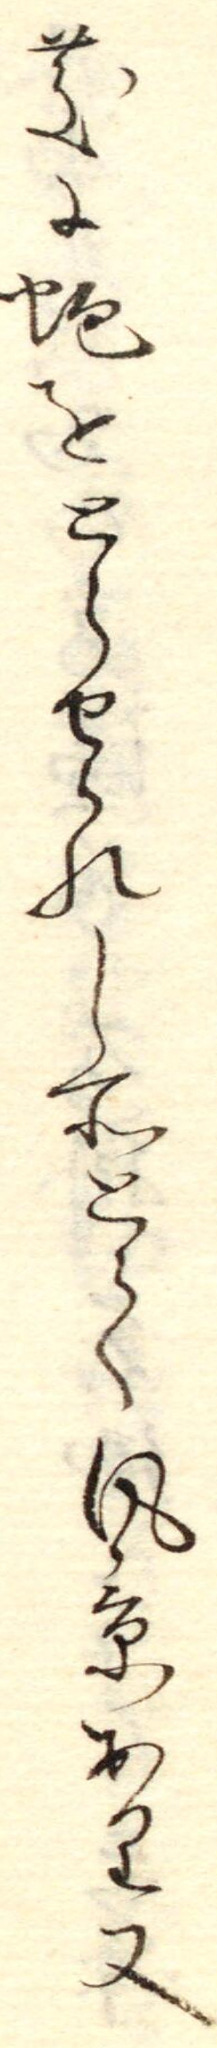慶に蚫をとらせられし所とて風景あり又
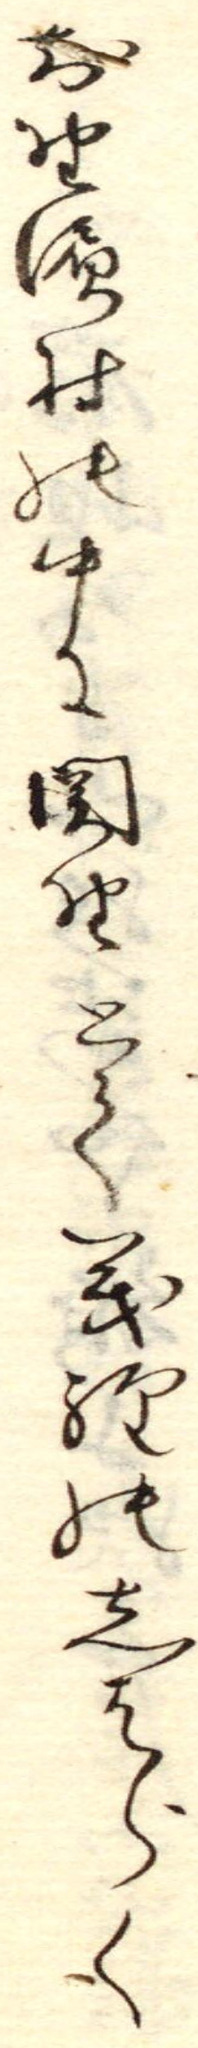前野浜村の中に関野とて義経のしはらく
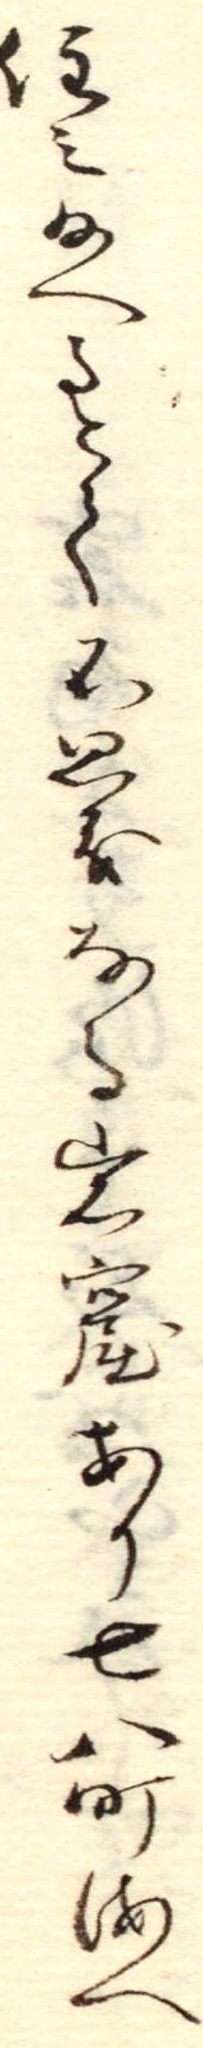住み給へるとて不思議なる岩窟あり七八町海へ
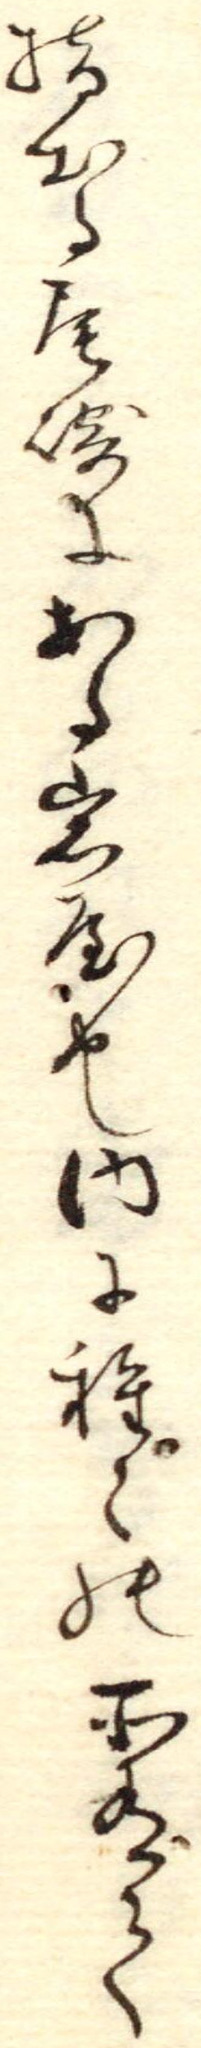指出る尾崎にある岩屋也内に種々の所有て
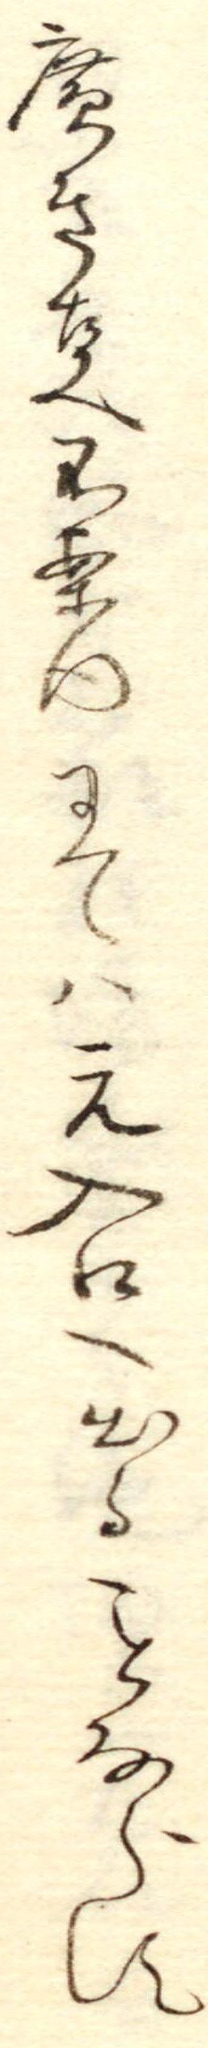広き事不案内にては元入口へ出ることならす
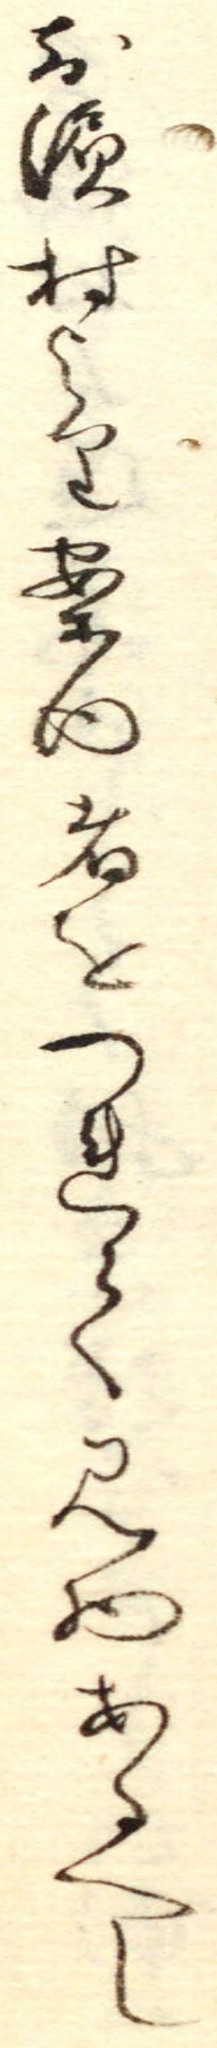前浜村より案内社者をつれて見物ありへし
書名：能登名跡誌
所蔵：Ishikawa Prefectural Library
